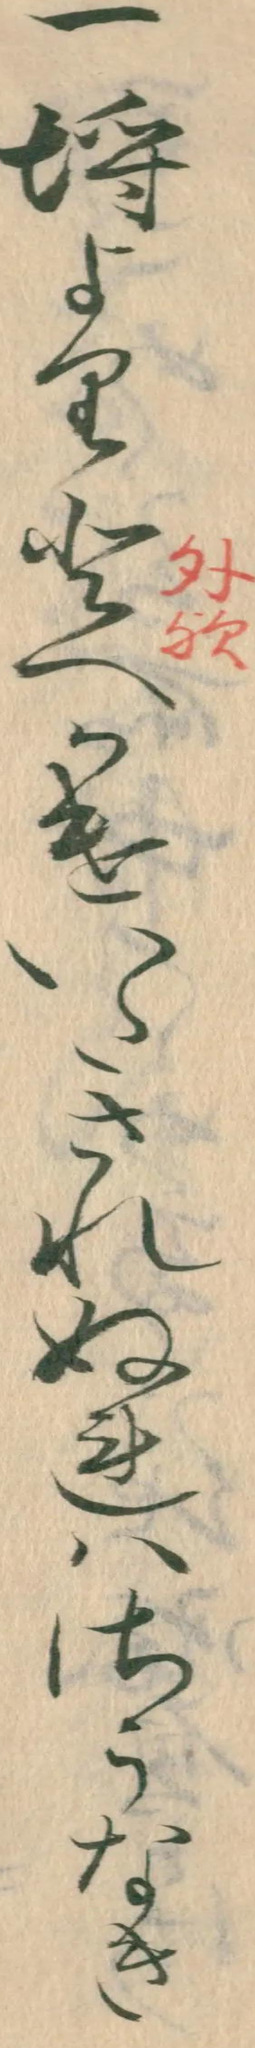一埒よりとへかけいたされぬれはさうなき
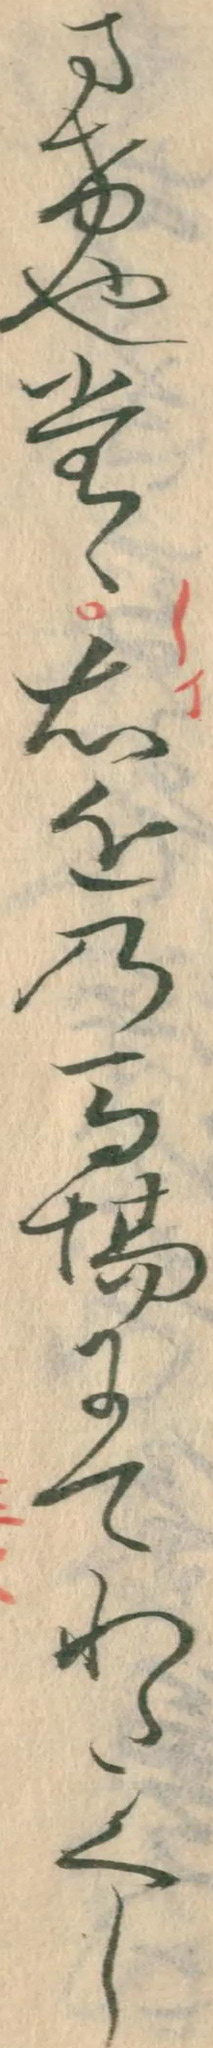まけ也たゝ右近の馬場にてわたくし
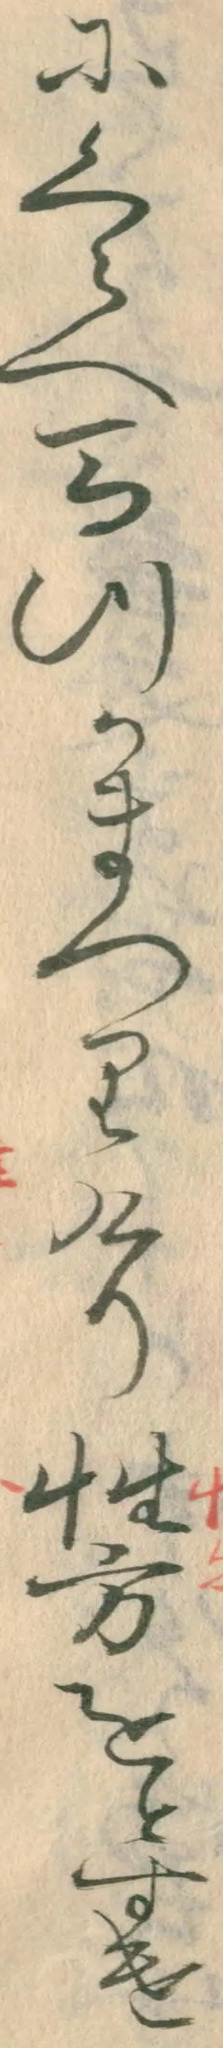にくらへ馬つかまつりけり性方をとすけ
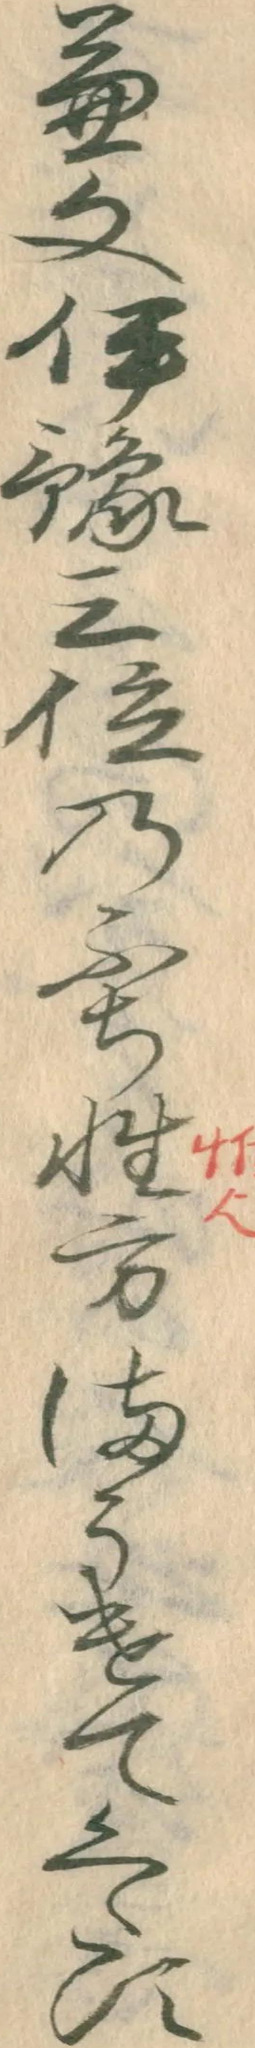兼文伊豫三位のふち性方まうけてくたす
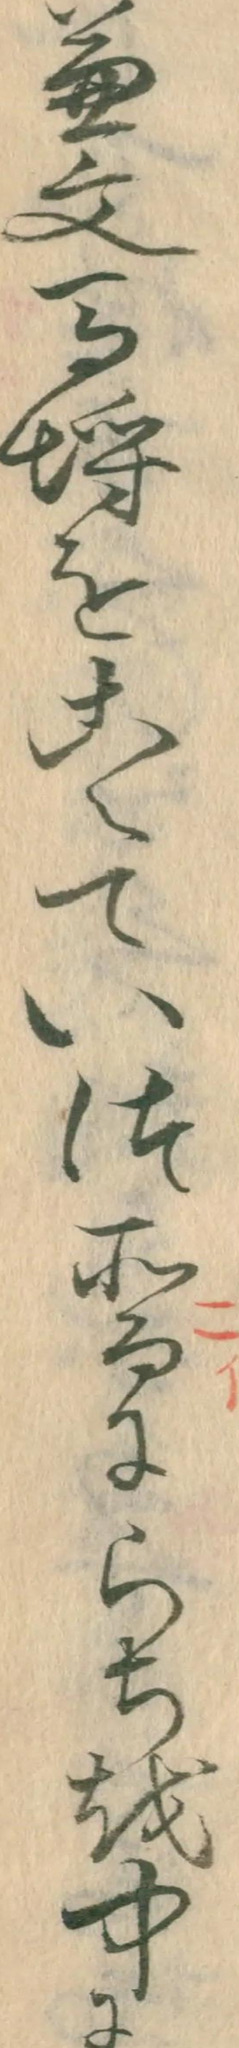兼文馬埒をこえていつするにらちを中に

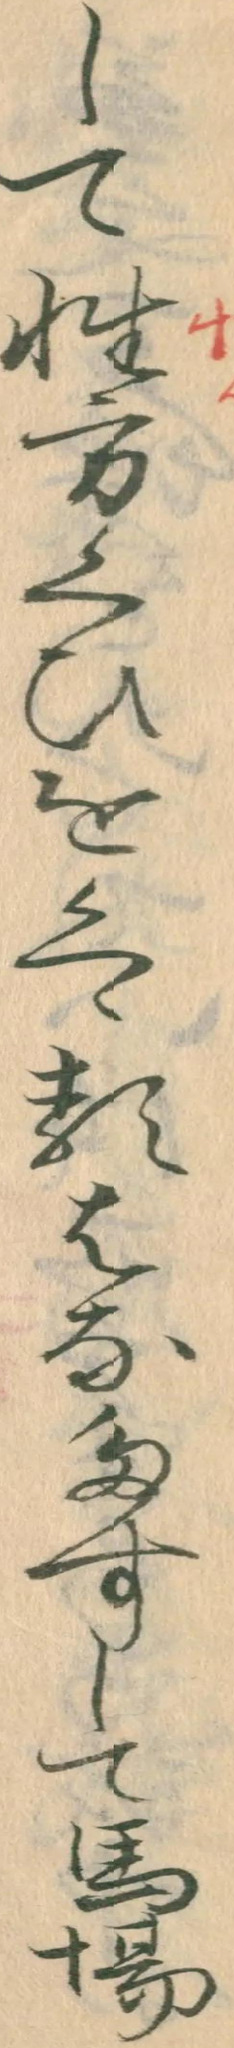して性方くひをくゝるはなたすして馬場
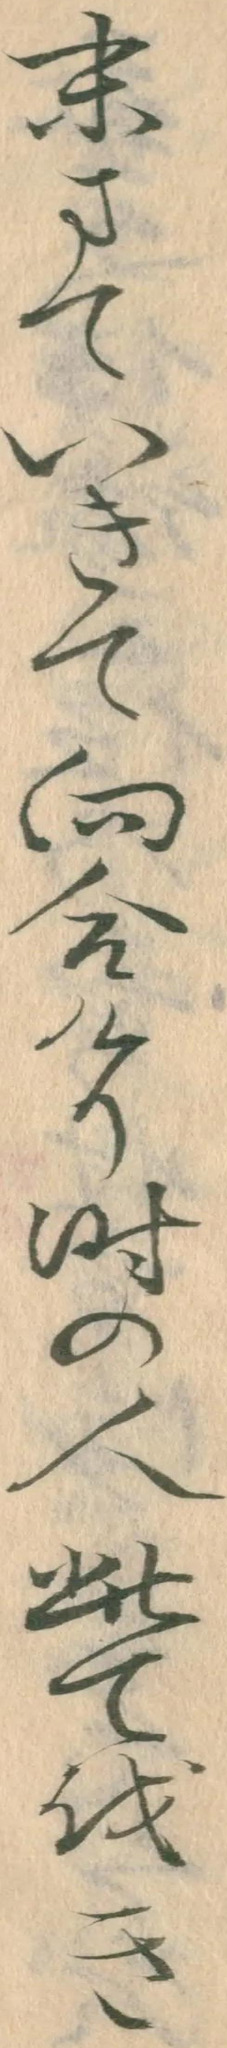末まていきて向合けり時の人此てをき
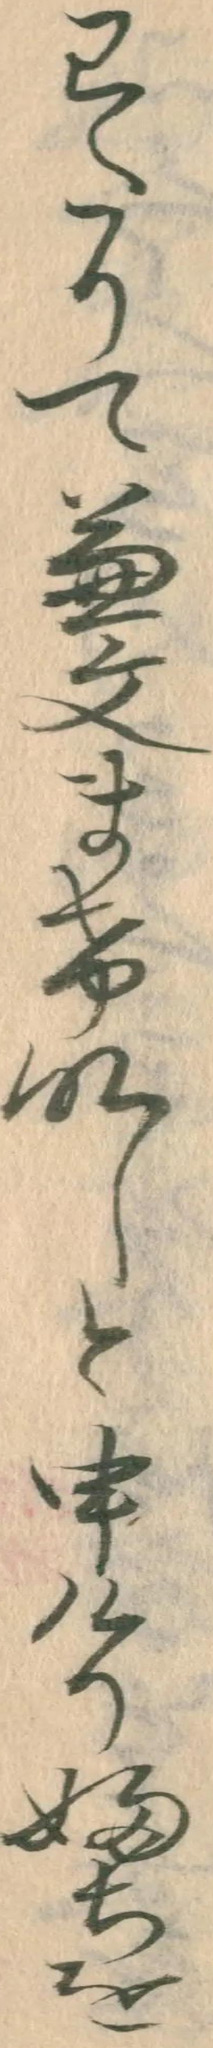わたりて兼文まけなしと申けりふちを
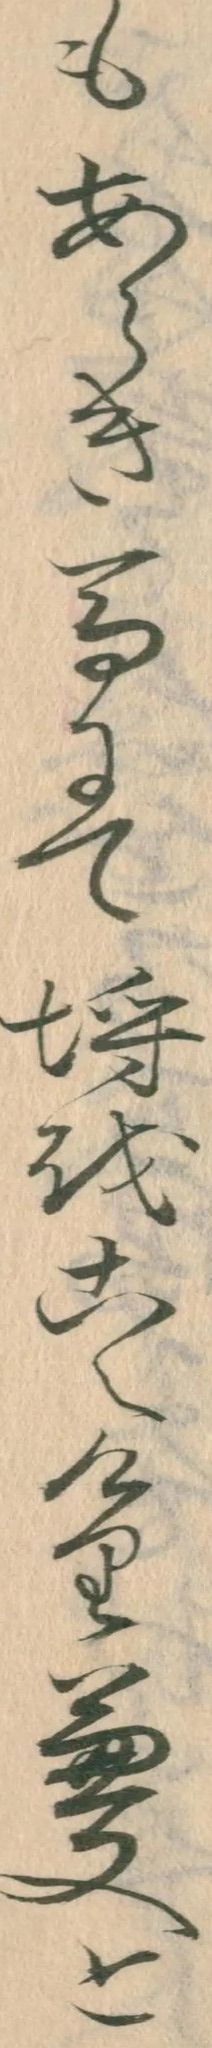もあらき馬にて埒をこえけり兼又と
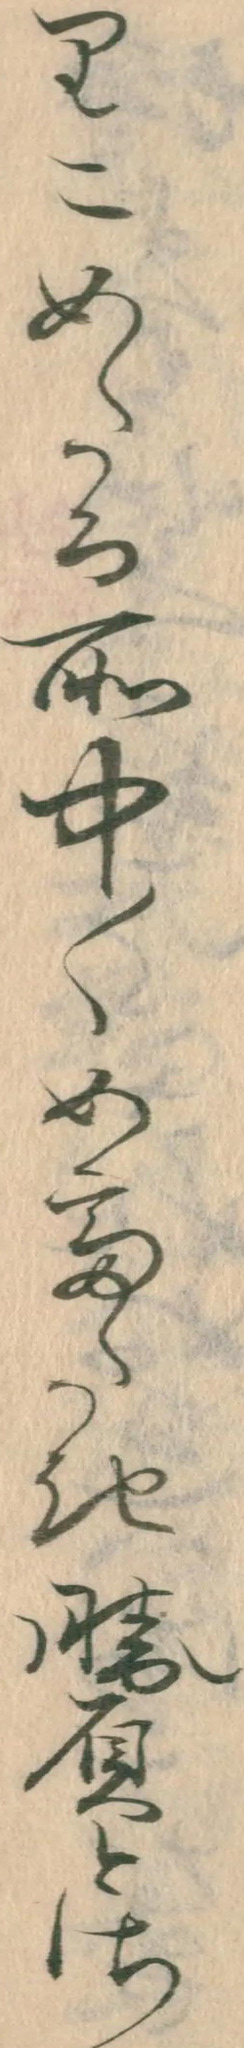りこめたる所中〳〵おめてたき勝負とさ
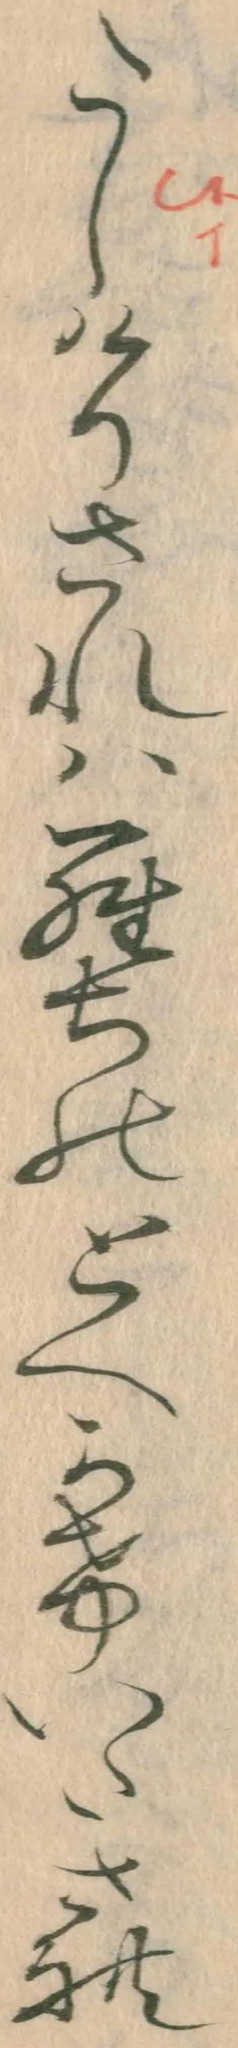たしけりされはらちのとへかけいたされ
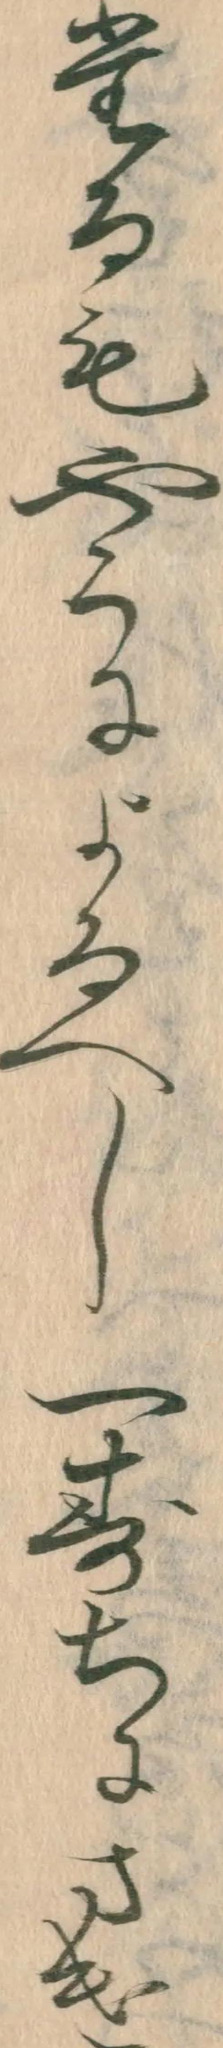たるもやうによるへし一すちにさけ
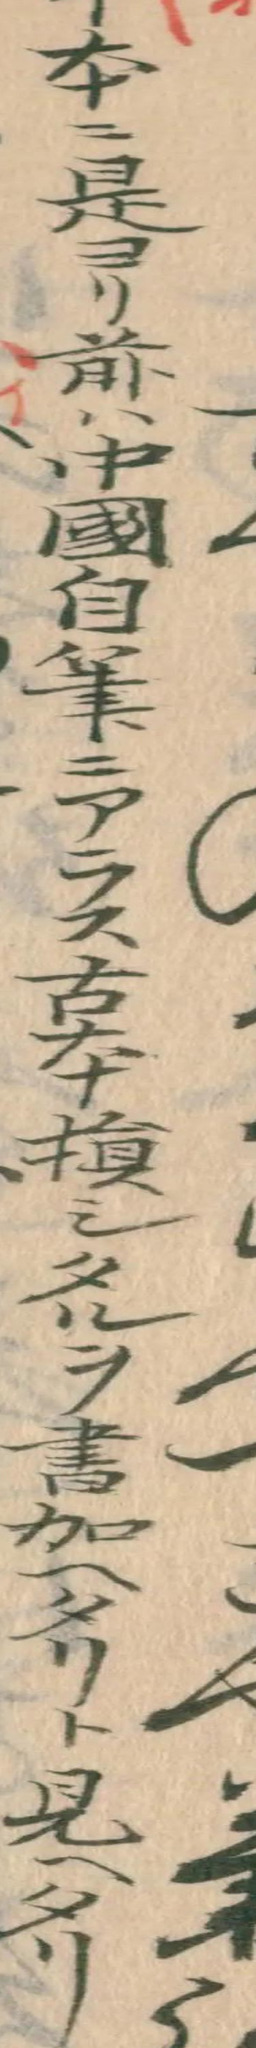イ本ニ是ヨリ前ハ中国自筆ニアラス古本損シタルヲ書加ヘタリト見ヘタリ
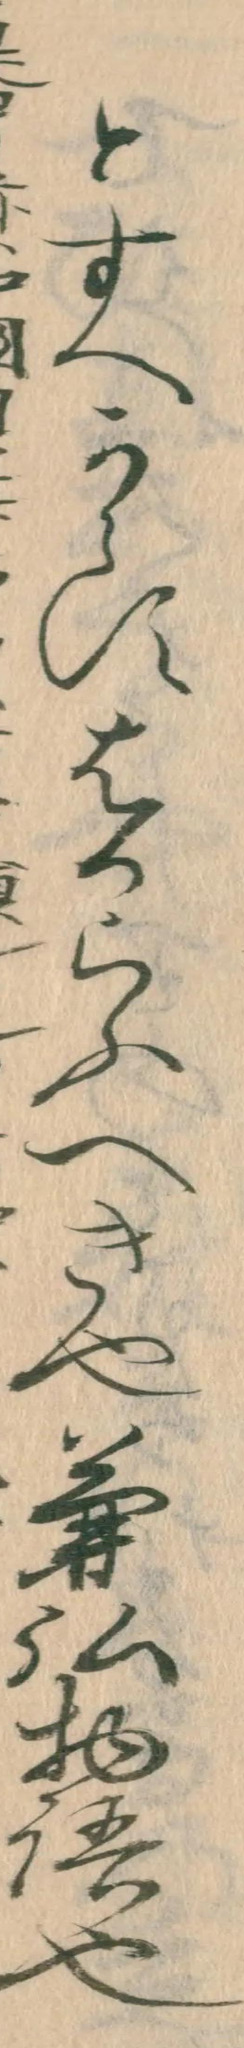とすへからすはからふへき也兼弘物語也
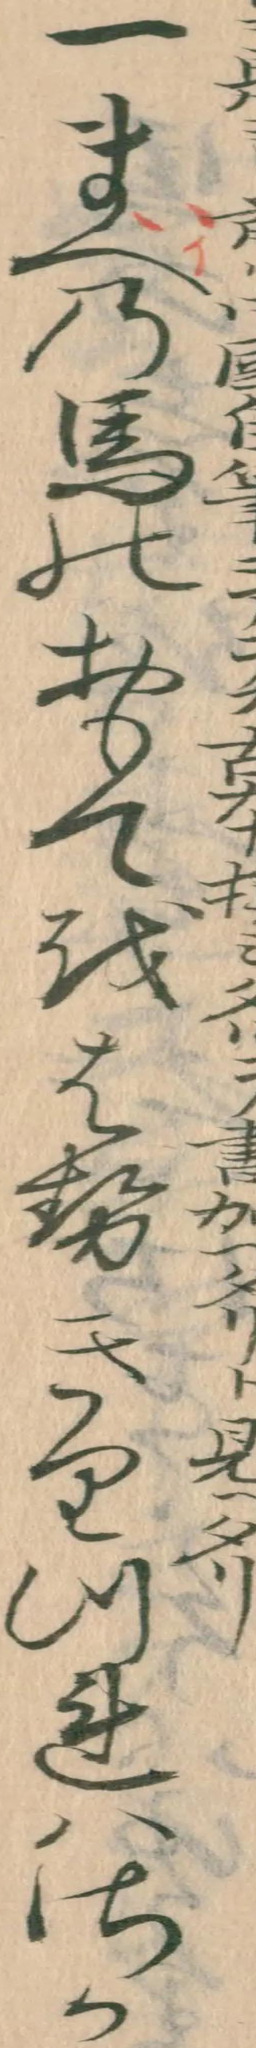一まへの馬のおもてをはせきりつれはさか
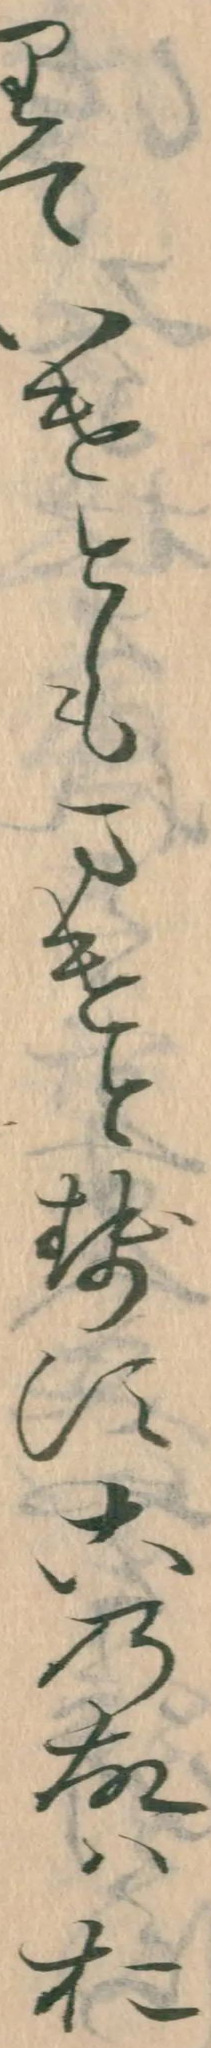りていけともまけとせすこの故はお
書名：賀茂社記録. 第13冊
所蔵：国立国会図書館 National Diet Library, JAPAN
